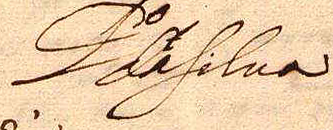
Po da silua
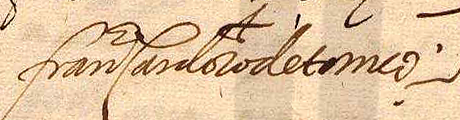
franco Cardozo de torneo
